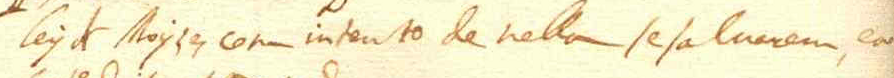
ley d̄ Moyses com intento de nella se saluarem, e a
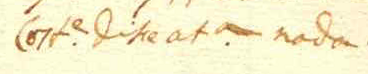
Cost.e disse a t.a nada.
